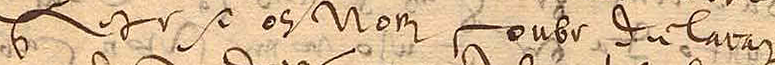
sete e os nom soube declarar
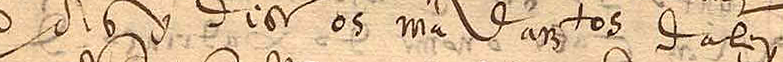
e Asy dise os ma̅damtos da ley
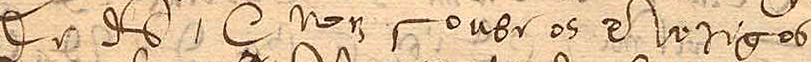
de ds̅ / e nom soube os clerigos
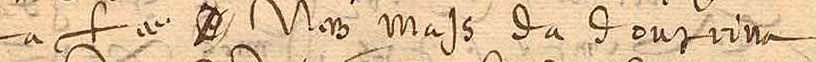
da fee _ Nem maJs da doutrina
